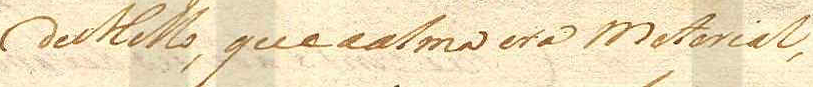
de Mello, que a alma era material,
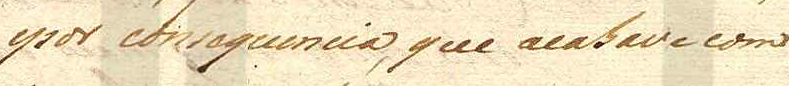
e por consequencia, que acabava com
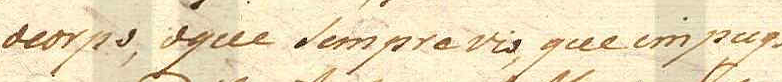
o corpo, o que sempre vio, que impug
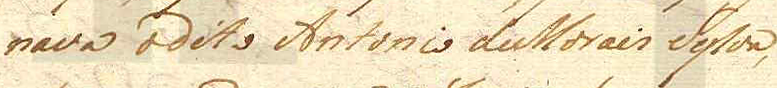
nava o dito Antonio de Morais Sylva,
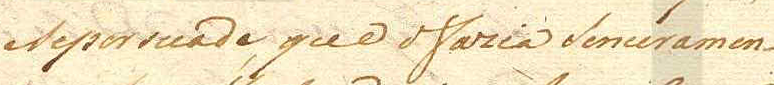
e se persuade, que o fazia senceramen
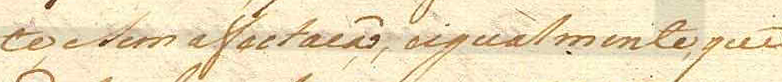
te, e sem afectação, e igualmente, que
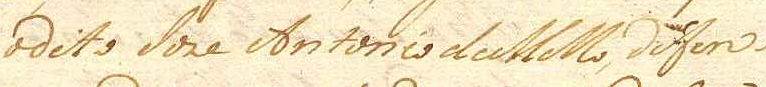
o ditto Ioze Antonio de Mello defen
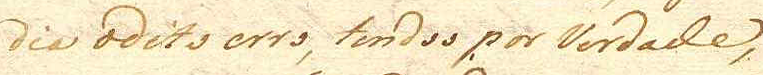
dia o dito erro, tendoo por Verdade,
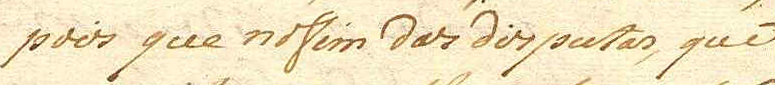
pois que no fim das disputas, que
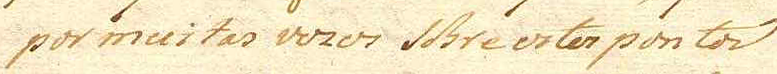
por muitas vezes sobre estes pontos
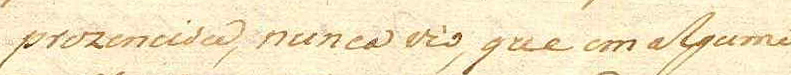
prezenciou, nunca vio, que em alguma
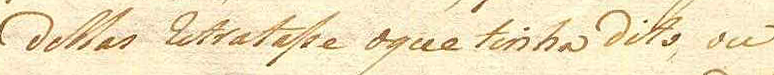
dellas Retratasse o que tinha dito, ou
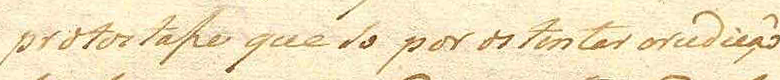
protestasse que so por ostentar erudiçaõ
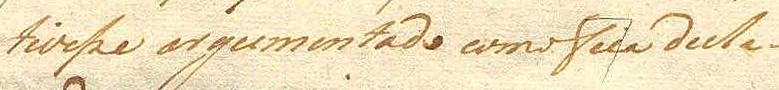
tivesse argumentado como fica decla
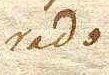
rado
